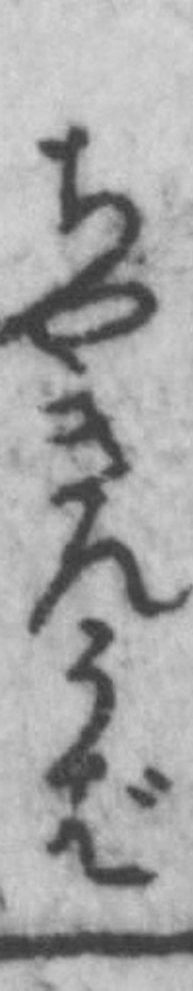ちやきんうば
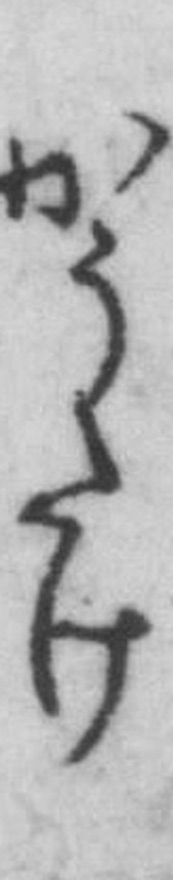かうたけ
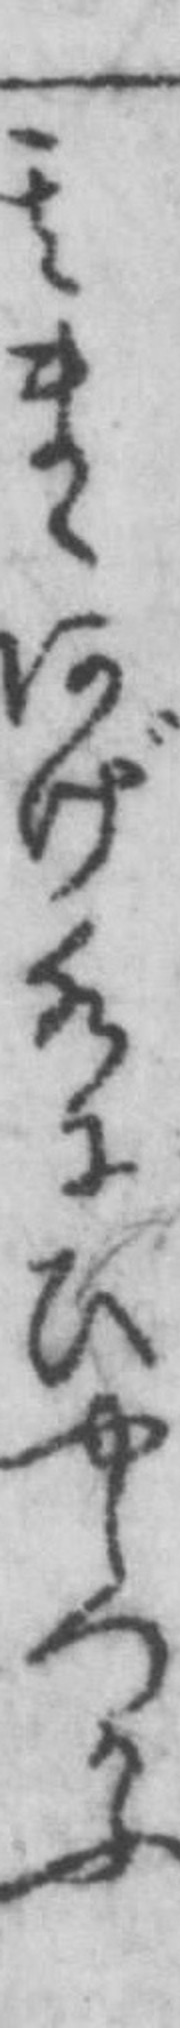其のまゝあげ水にひやしつかふ
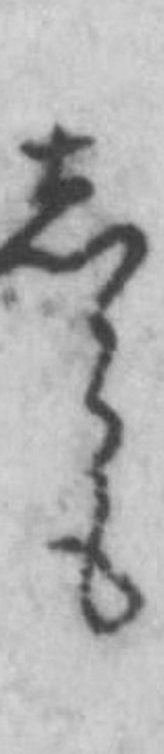しらも
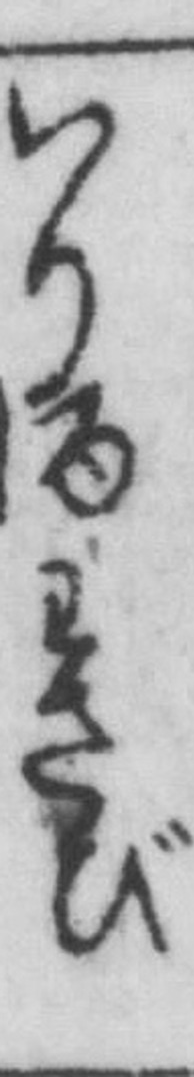いり酒わさび
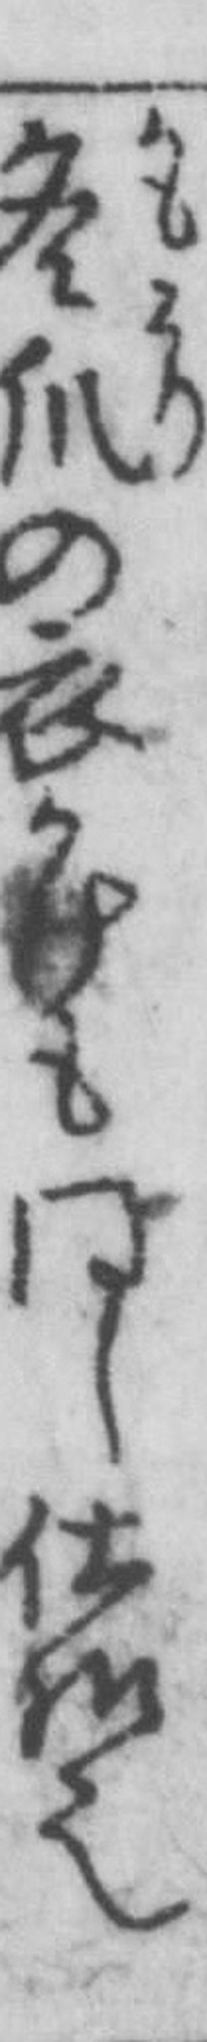冬瓜の衣かけも同し仕作也
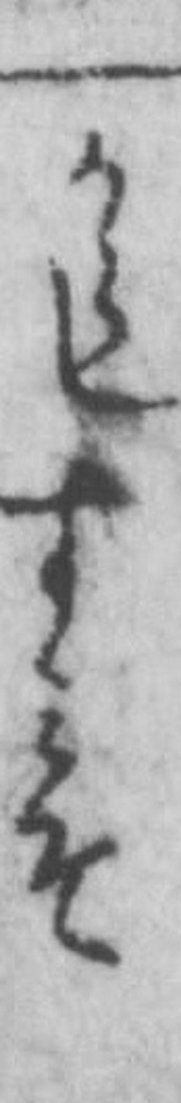からしすミそ
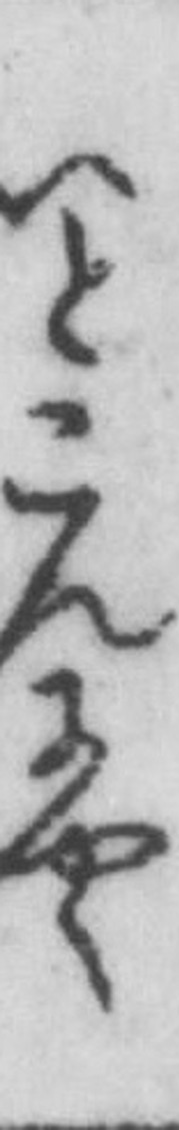えいこんにやく
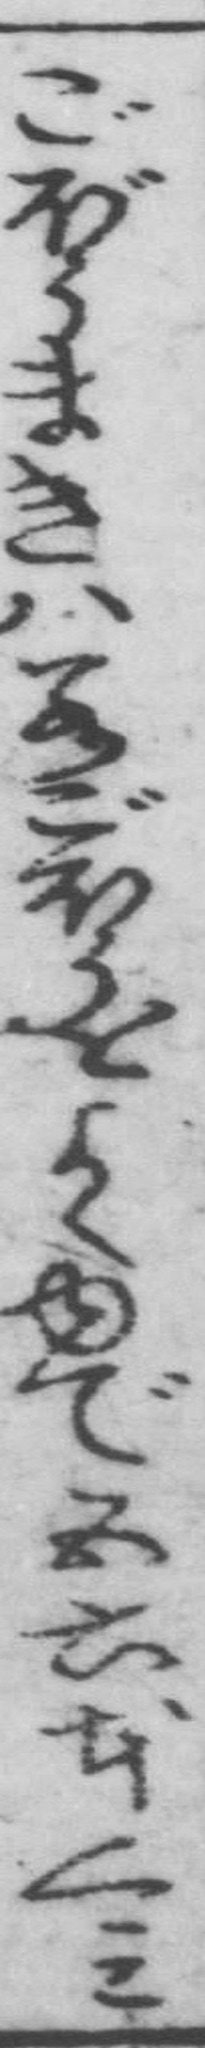ごぼうまきハごぼうをよくゆで五六本くミ
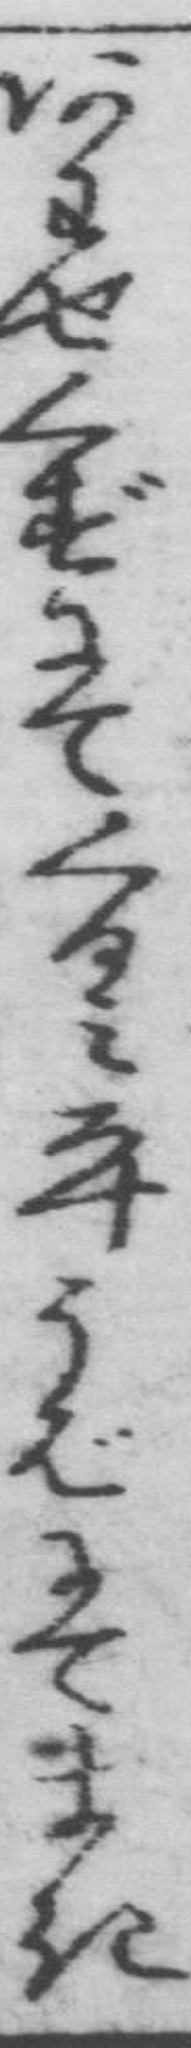あわせくずにてくるミ平うばにてまき
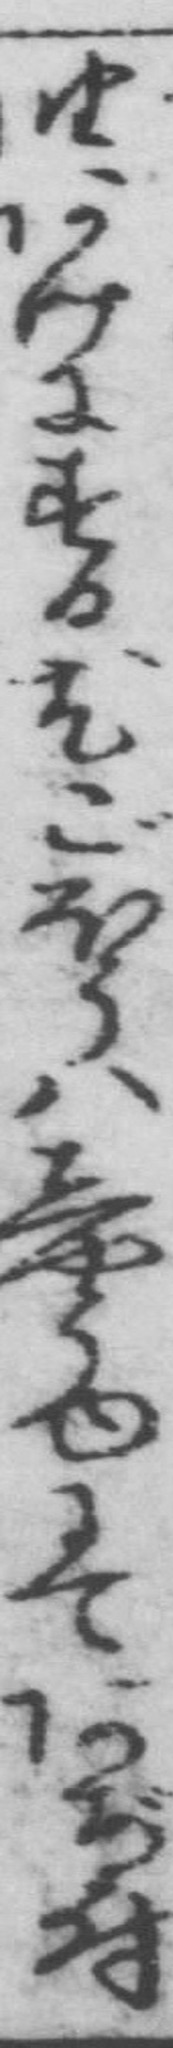油あげにする尤ごほうハしやうゆにてあぢ付
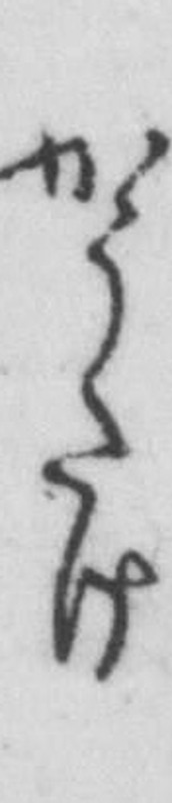かうたけ
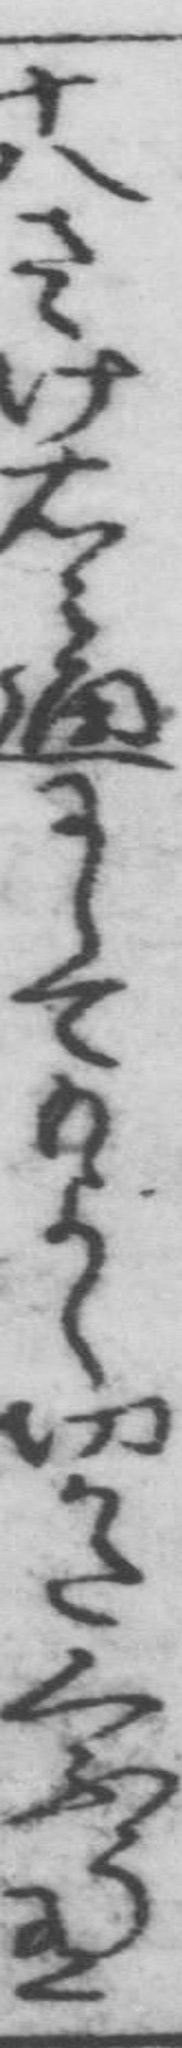十六さけ右の通にしてもよし切かたくふう
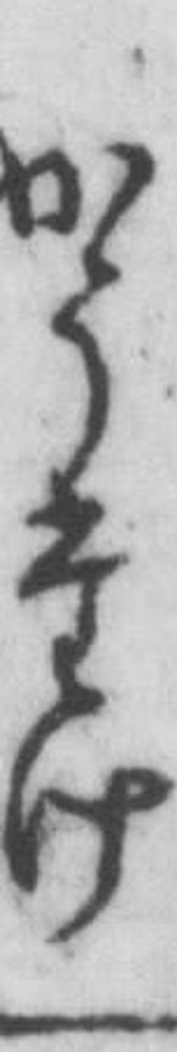かうたけ
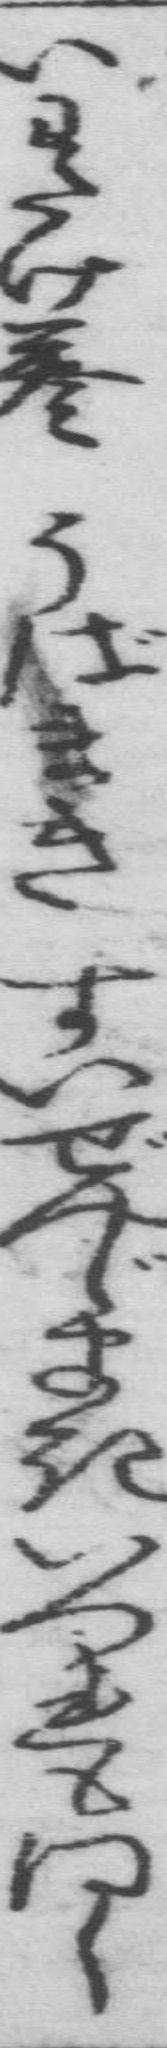いわたけ巻うばまきすいぜんじまきいつれも同し
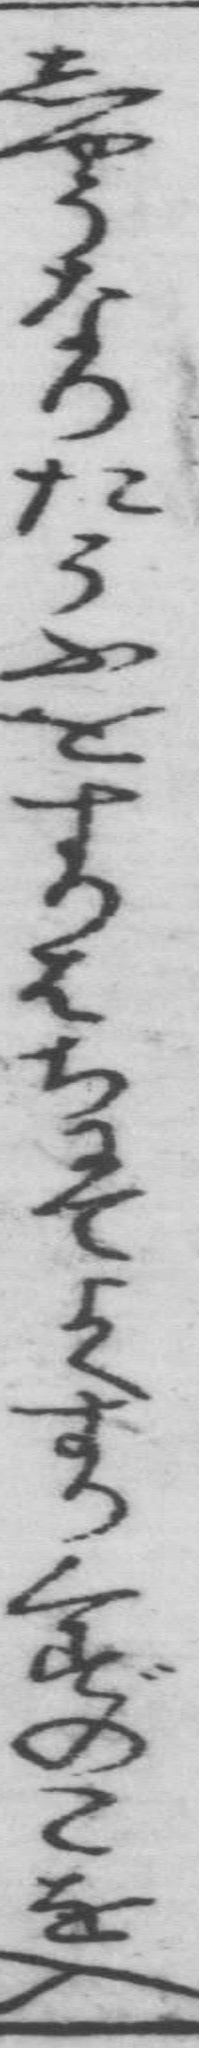しやうなりたいふをふりはちにてよくすりくずのこを入
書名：料理献立抄
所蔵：大阪府立大学学術情報センター 国文学研究資料館
